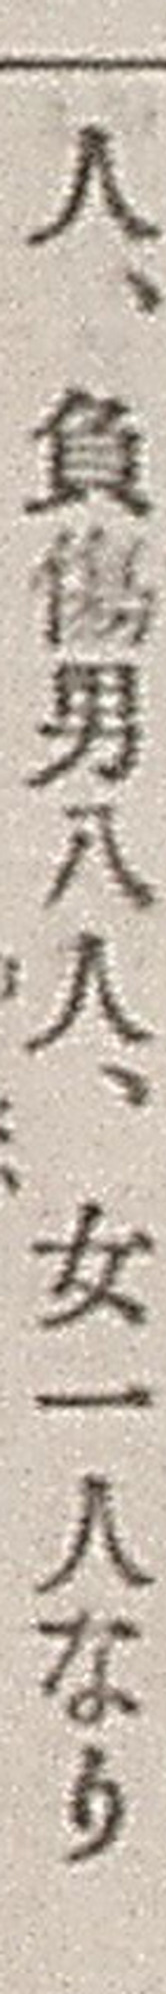人、負傷男八人、女一人なり
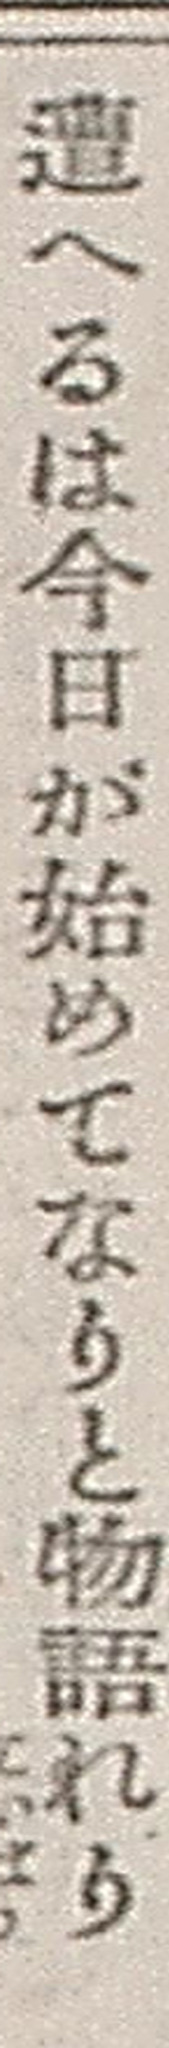遭へるは今日が始めてなりと物語れり
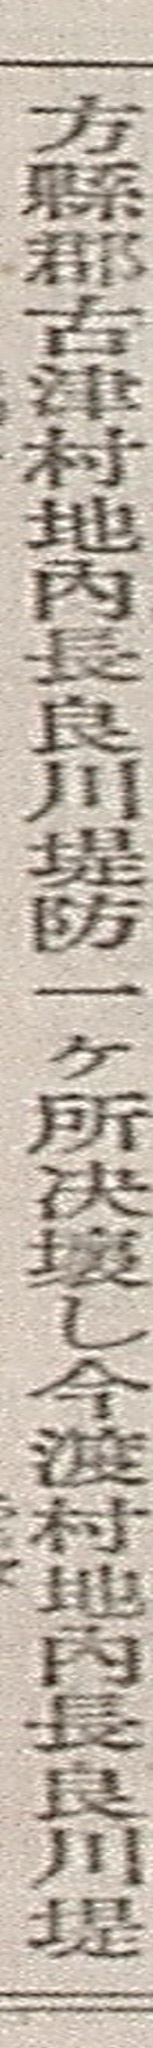方縣郡古津村地内長良川堤防一ヶ所決壊し今渡村地内長良川堤
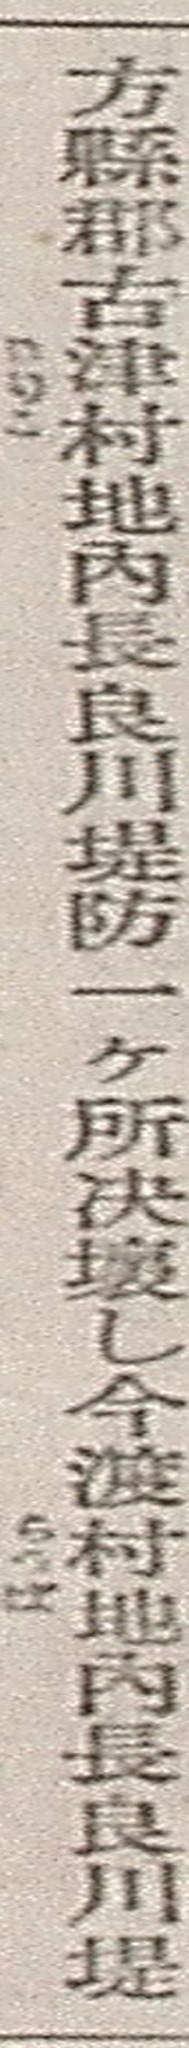方縣郡古津村地内長良川堤防一ヶ所決壊し今渡村地内長良川堤
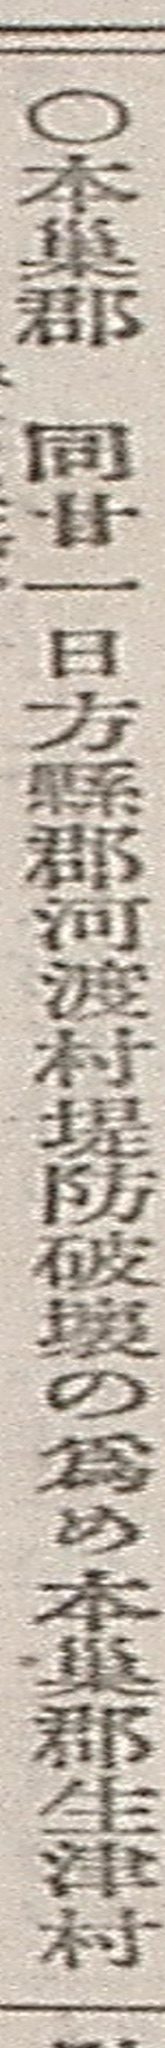◯本巣郡同廿一日方縣郡河度村堤防破壊の為め本巣郡生津村
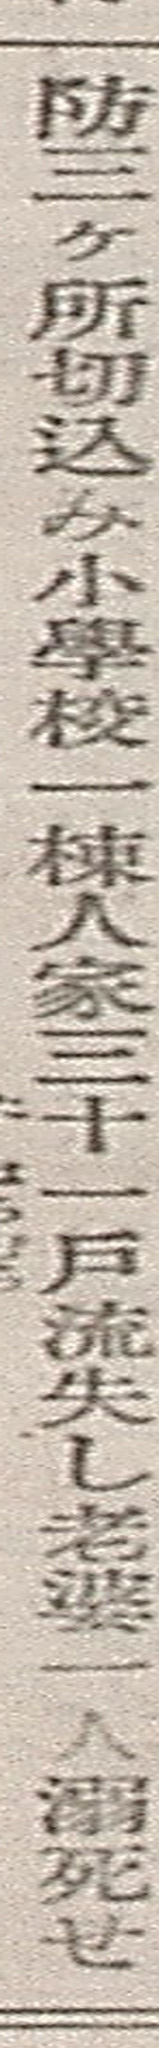防三ヶ所切込み小学校一棟人家三十一戸流失し老婆一人溺死せ
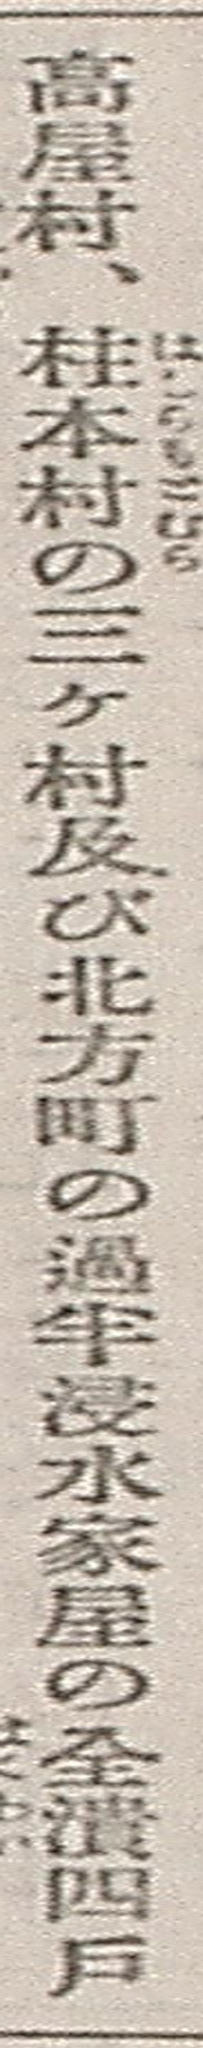高屋村、柱本村三ヶ村及び北方町の過半浸水家屋の全潰四戸
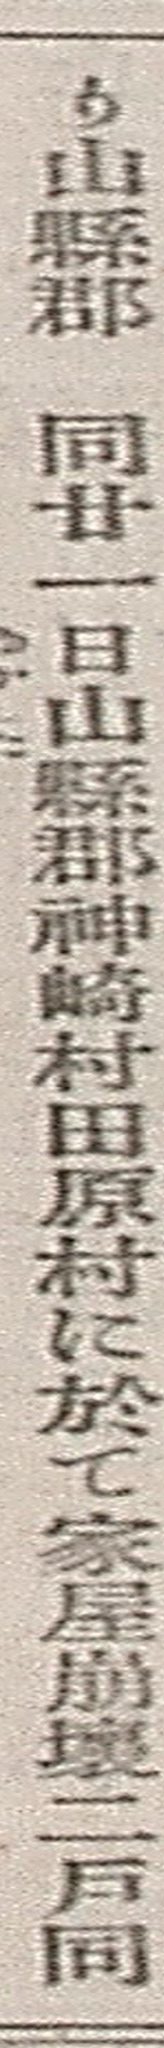り山縣郡同廿一日山縣郡神崎村田原村に於て家屋崩壊二戸同
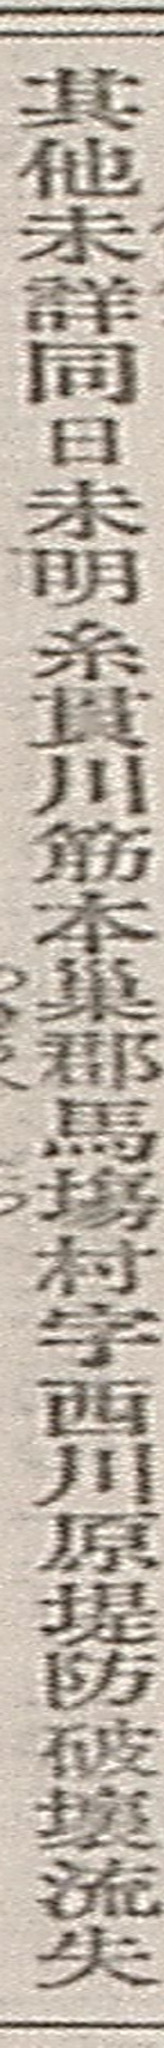其他未詳同日未明糸貫川筋本巣郡馬場村字西川原堤防破壊流失
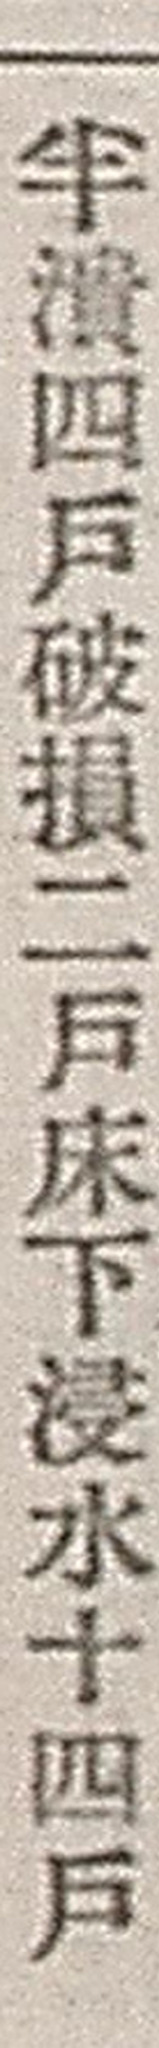半潰四戸破損二床下浸水四戸
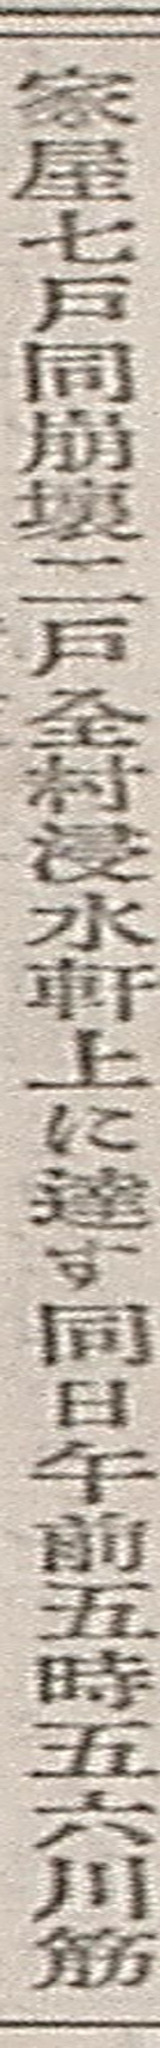家屋七戸同崩壊二戸全村浸水軒上に達す同日午前五時五六川筋
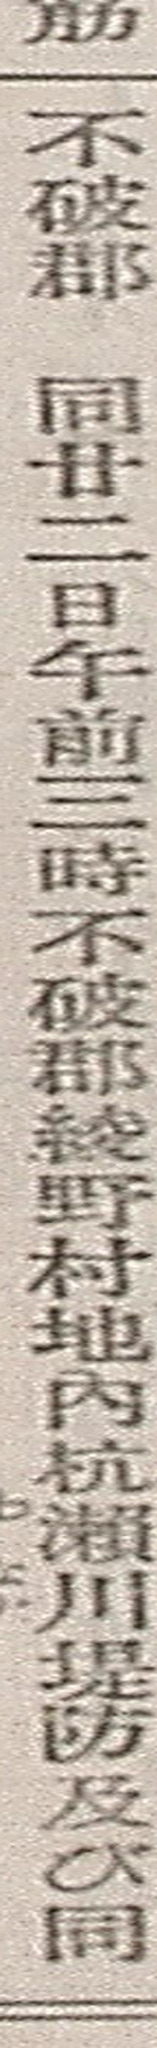不破郡同廿二日午前三時不破郡綾野村地内杭瀬川堤防及び同
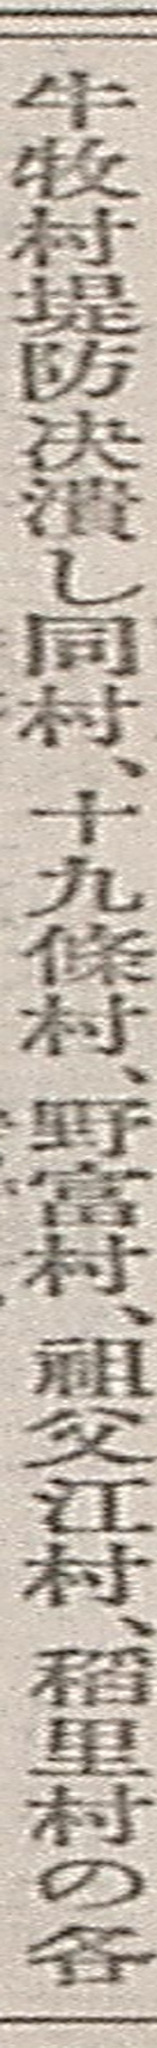牛牧村堤防决潰し同村、十九條村、野富村、祖父江村、稲里村の各
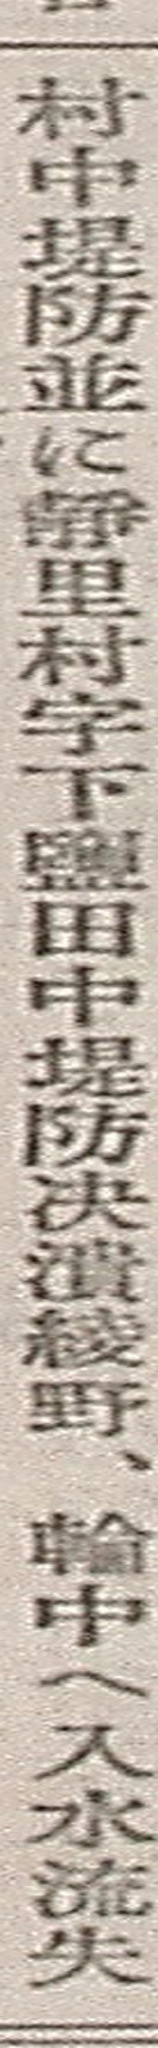村中堤防並に静里村字塩田中堤防决潰綾野、輪中へ入水流失
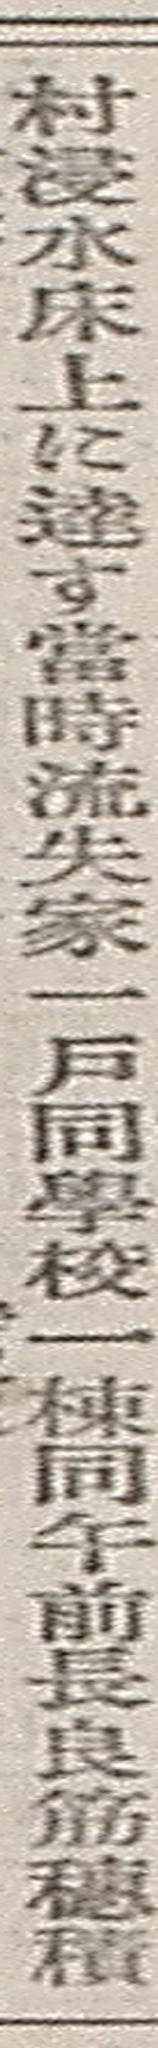村浸水床上に達す当時流失家一戸同学校一棟同午前長良筋穂積
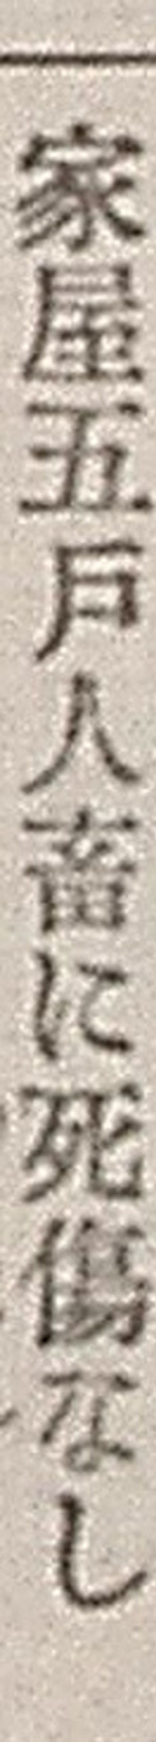家屋五戸人畜に死傷なし
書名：風俗畫報臨時増刊第百二十六號　洪水被害録（中）
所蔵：東京大学地震研究所図書室 Earthquake Research Institute Library, The University of Tokyo, JAPAN
